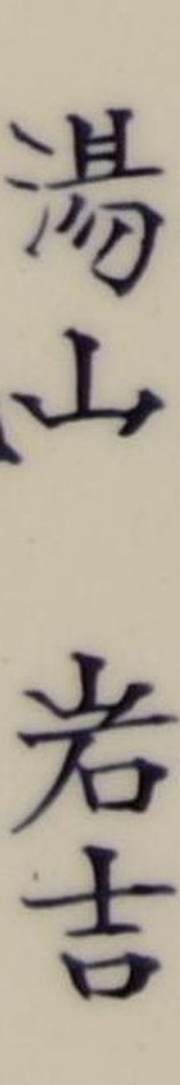湯山岩吉
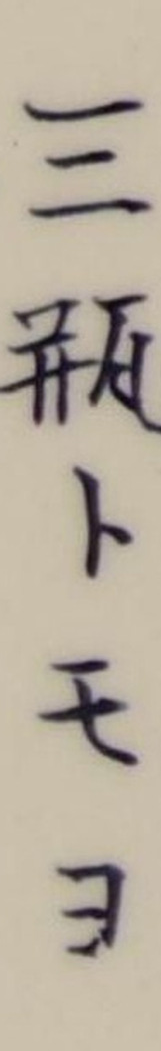三瓶トモヨ
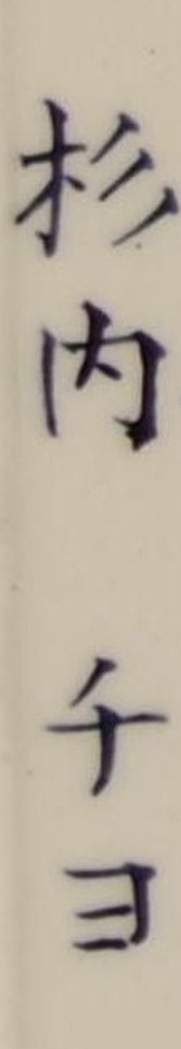杉内チヨ

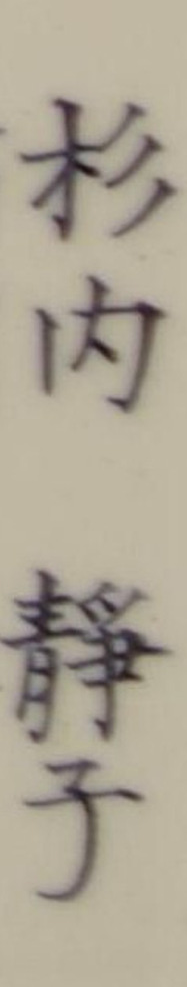杉内静子
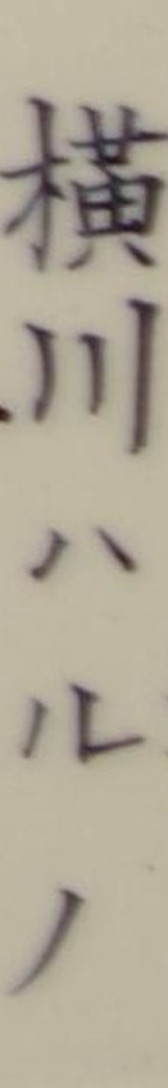横川ハルノ
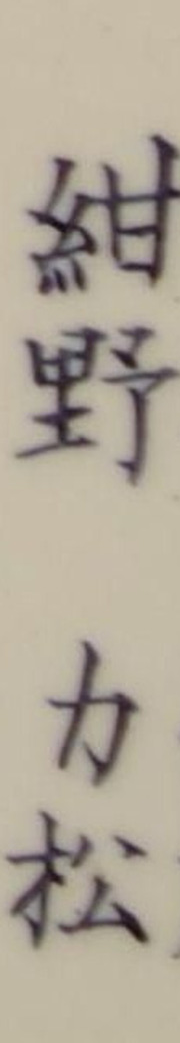紺野力松
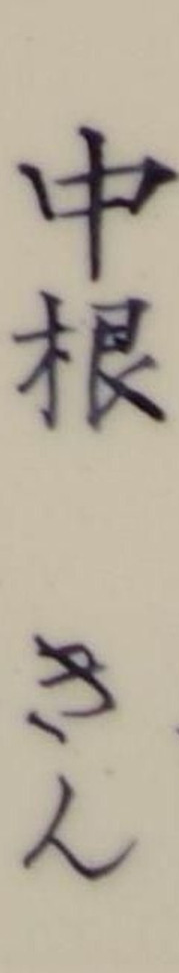中根きん
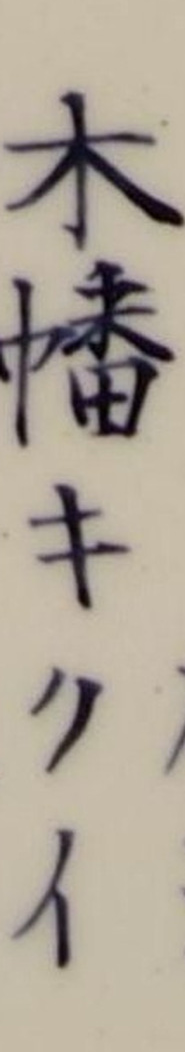木幡キクイ
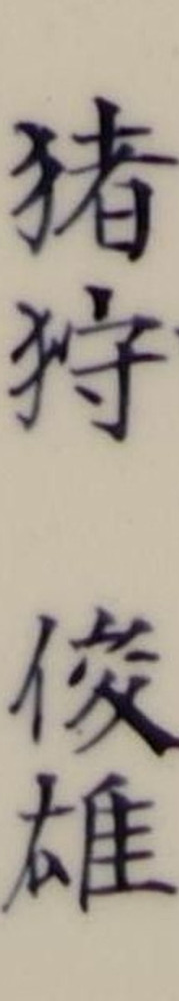猪狩俊雄
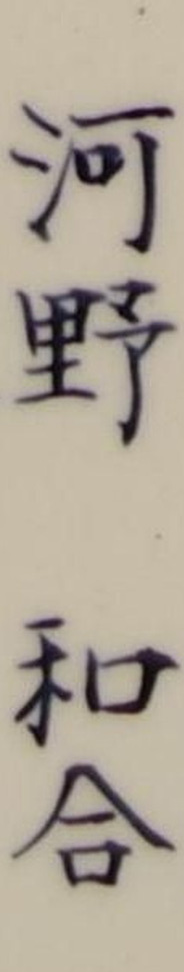河野和合
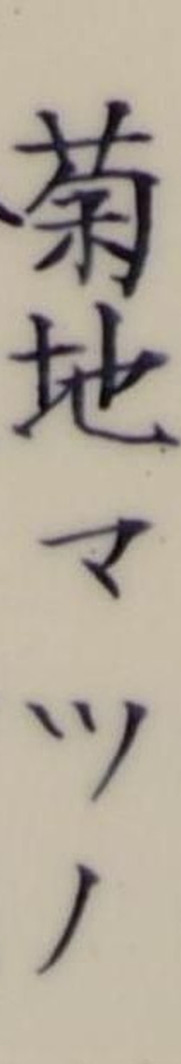菊地マツノ
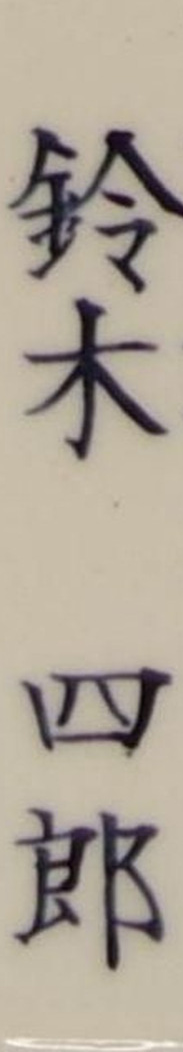鈴木四郎

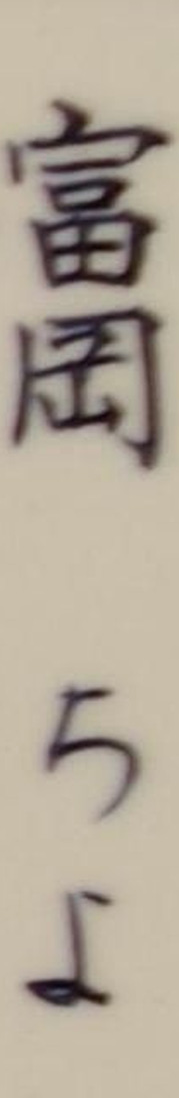富岡ちよ
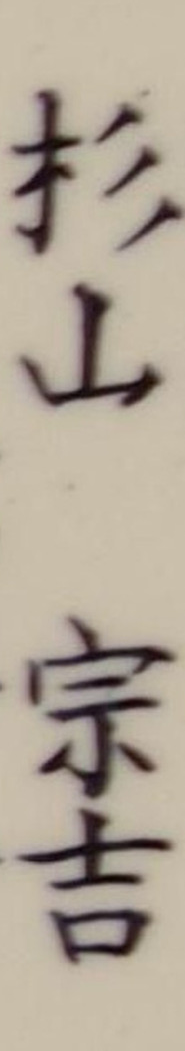杉山宗吉
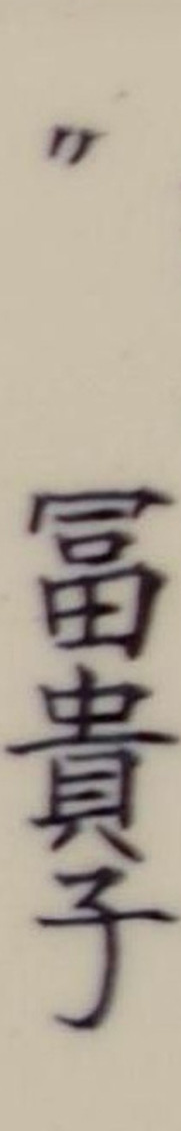冨貴子
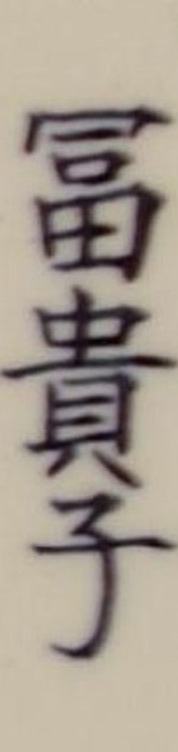冨貴子
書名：E~L
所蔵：高野山金剛峯寺
